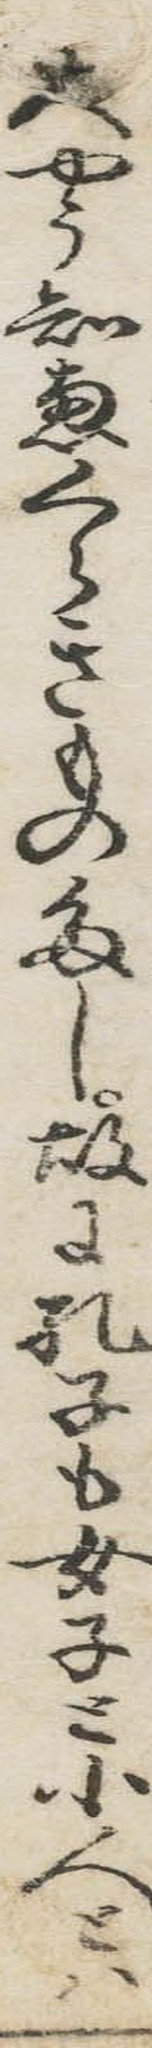大やう知恵くらきもの多し。故に孔子も女子と小人とは
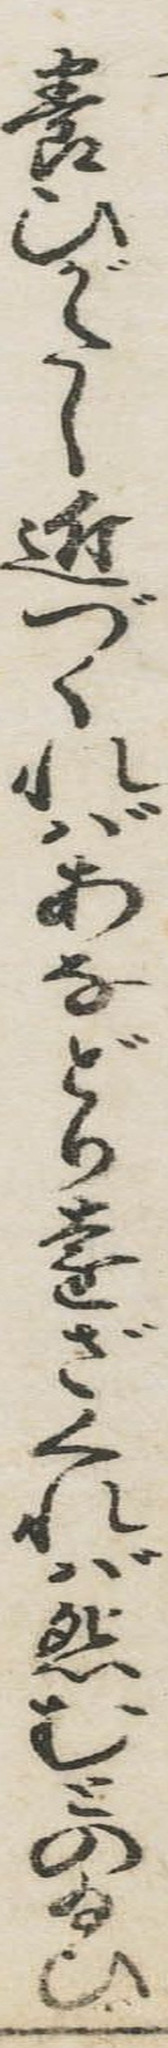養ひがたし近づくればあなどり遠ざくれば怨むとの給ひ
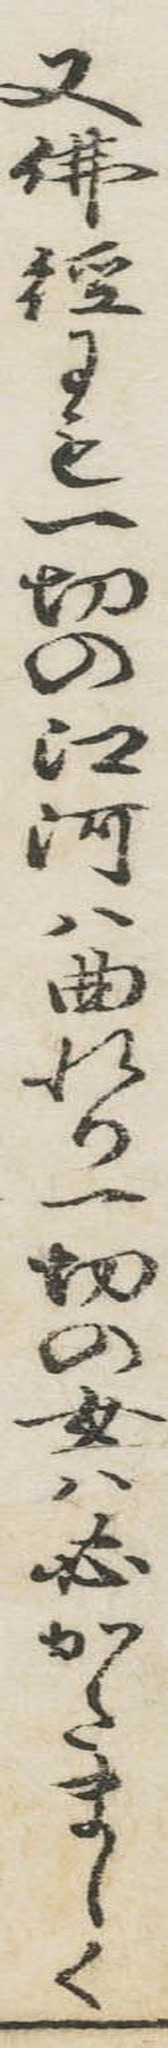又仏経にも一切の江河は曲れり一切の女は必かたましく
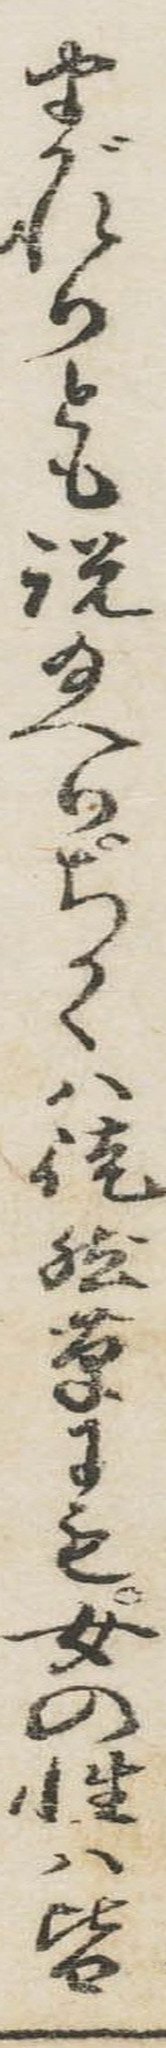まがれたりとも説給へり。ちかくは徒然草にも。女の性は皆
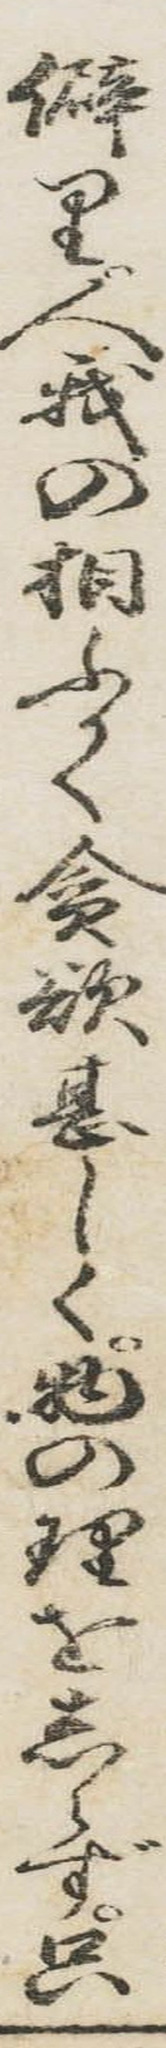僻り。人我の相ふかく貪欲甚しく。物の理をしらず。只
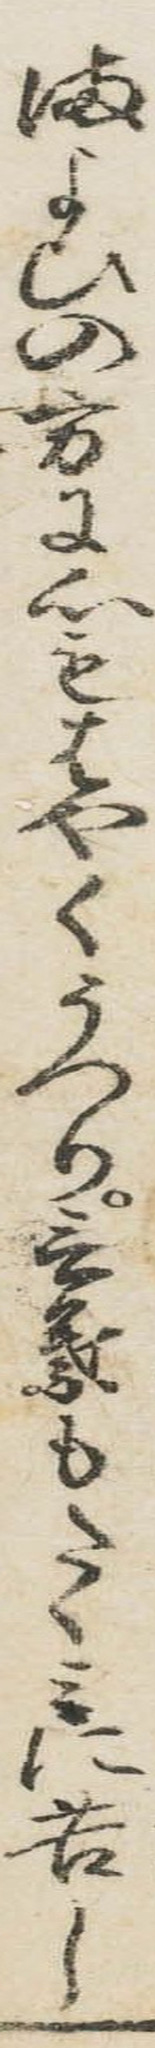まよひの方に心もはやくうつり。言葉もたくみに苦し
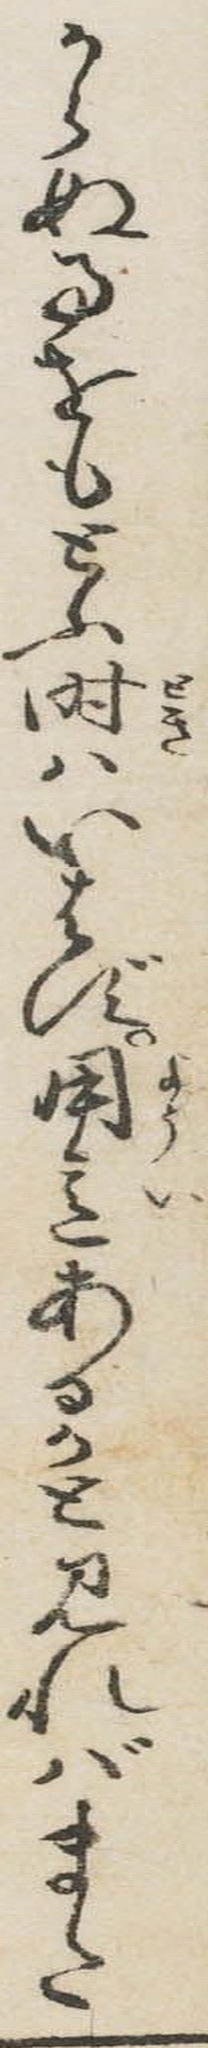からぬ事をもとふ時はいはず。用意あるかと見ればまた
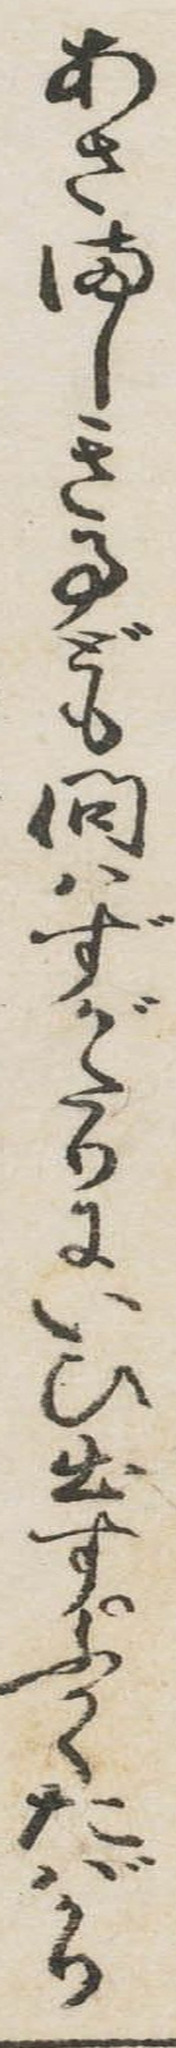あさましき事ども問はずがたりにいひ出す。ふかくたばかり
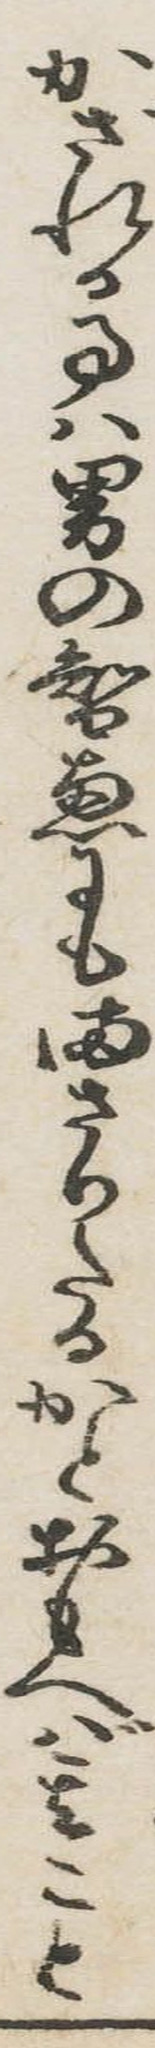かざれる事は男の智恵にもまさりたるかとおもへば其こと
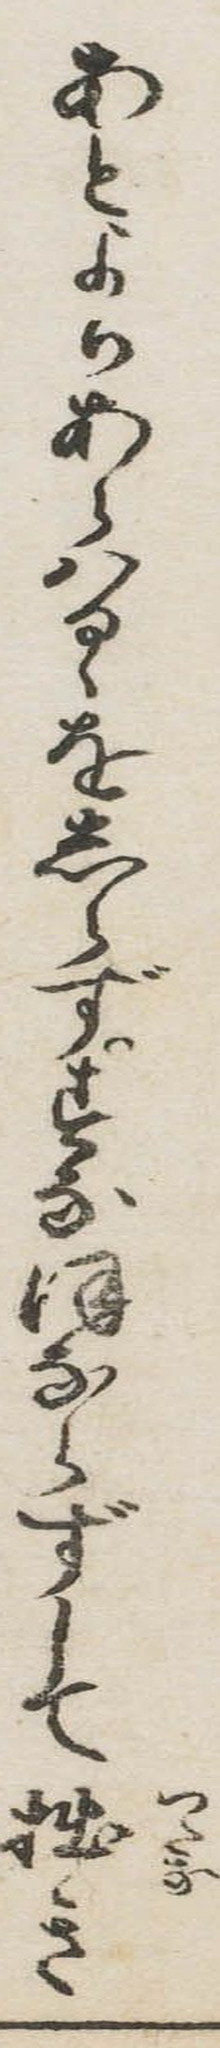あとよりあらはるゝをしらず。すなほならずして拙き
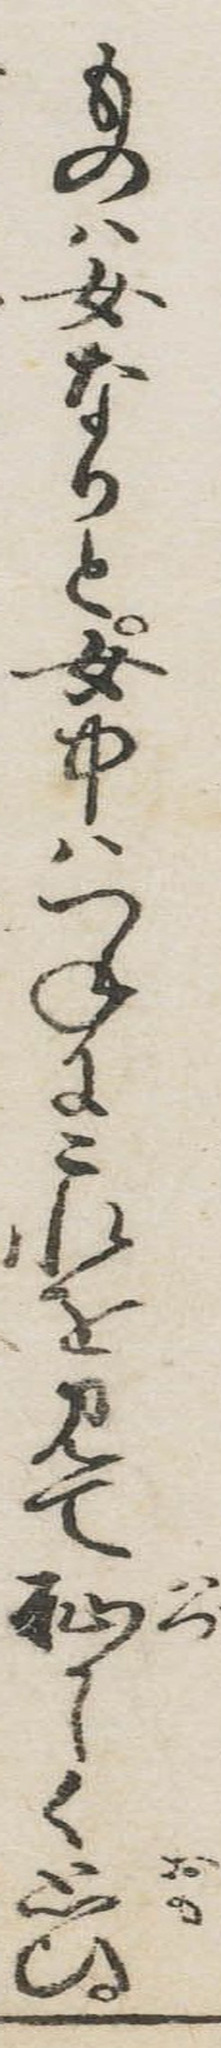ものは女なりと。女中はつねにこれを見て恥かしく思ひ。
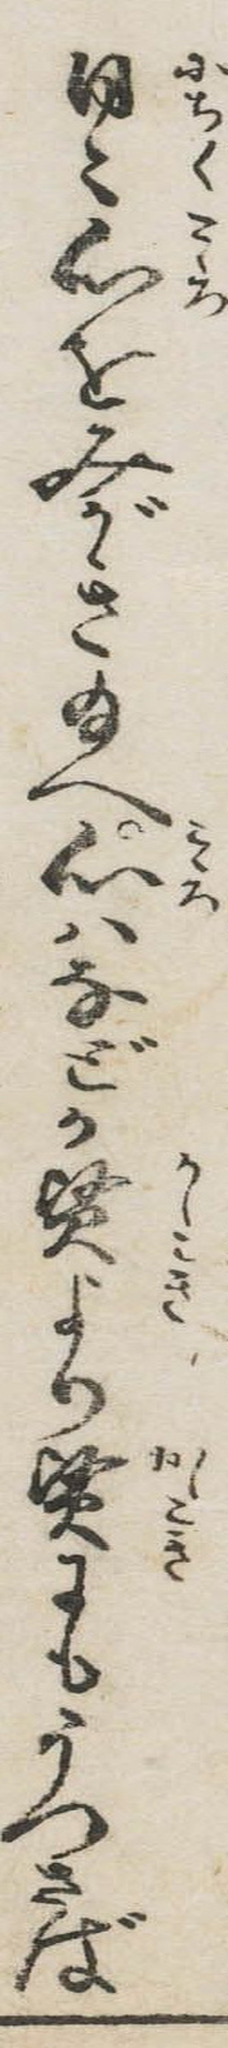日々心をみがき給へ。心はなどか賢より賢にもうつさば
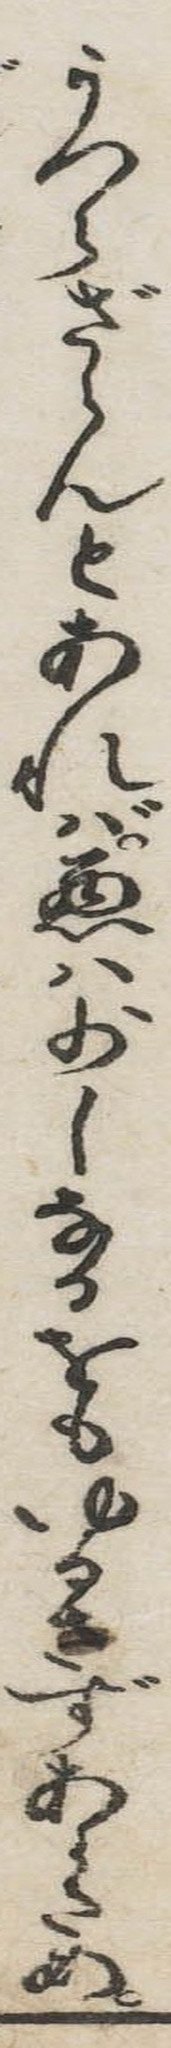うつらざらんとあれば。悪は少しなるをもゆるさずあらため。
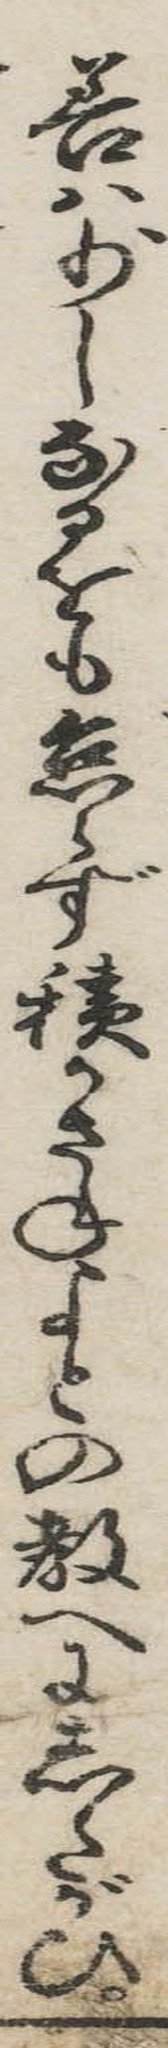善は少しなるをも怠らず積みかさねよとの教へにしたがひ。
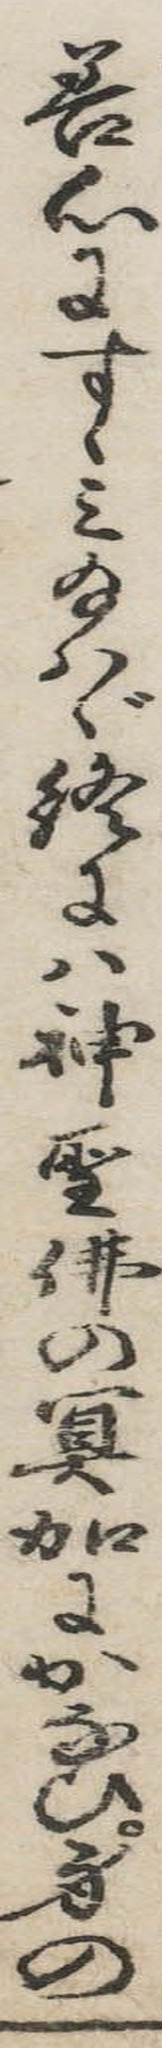善心にすゝみ給はゞ終には神聖仏の冥加にかなひ。身の
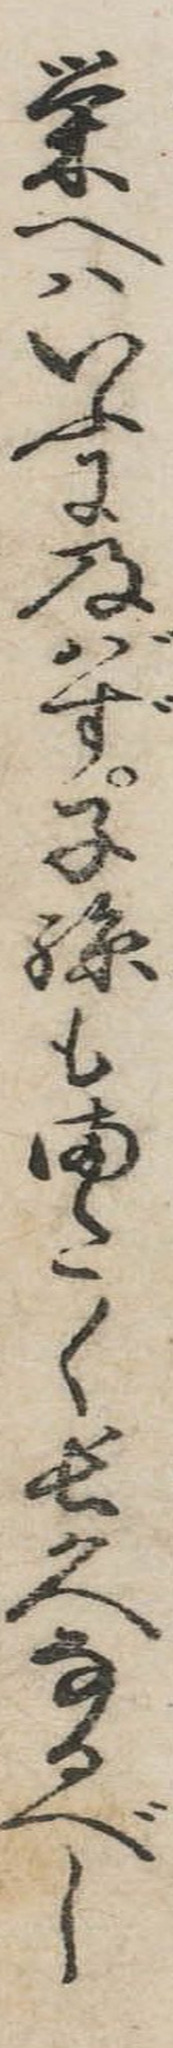栄へはいふに及ばず。子孫もまた〳〵長久なるべし
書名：前訓
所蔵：東京学芸大学附属図書館
